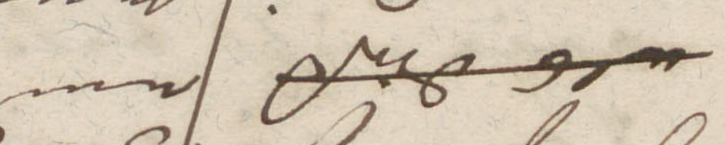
noch in dem Stile der
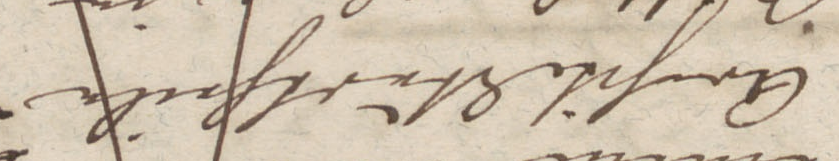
weniger metamorphosirt in
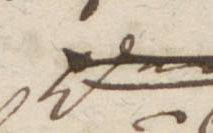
schärfer
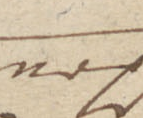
% und in Indien
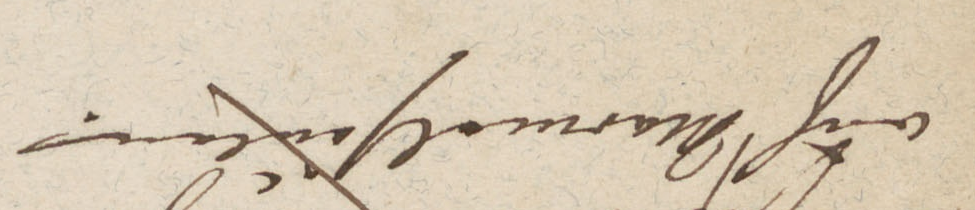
in der bereits erwähnten
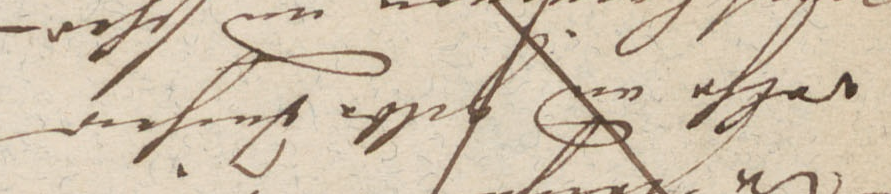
anspielte, der andere in
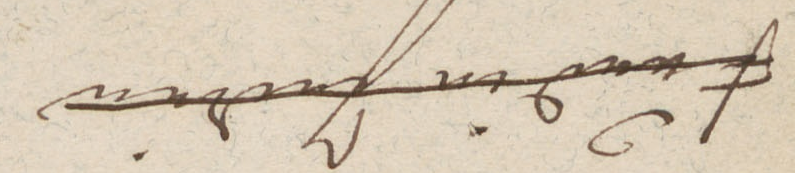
hiengen weisse
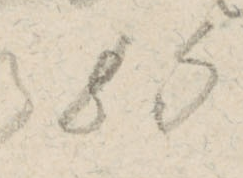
183.
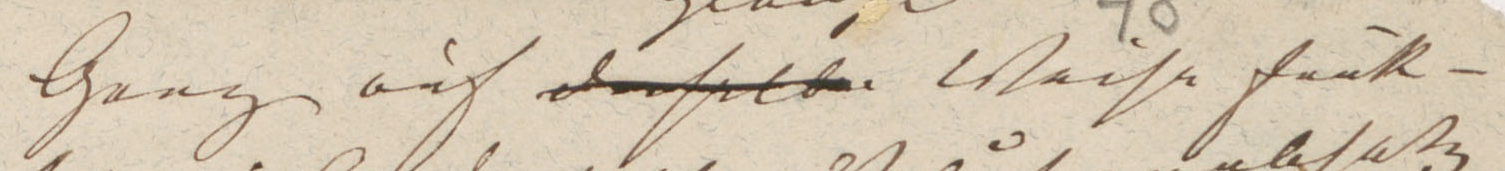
Ganz auf derselbe gleiche Weise funk-
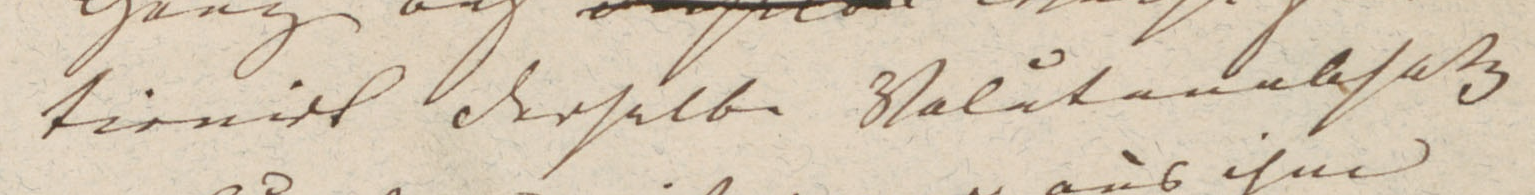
tionirt derselbe Volutenabsatz
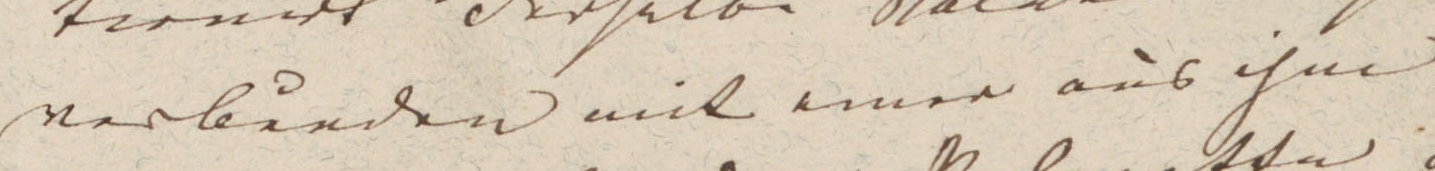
verbunden mit einer aus ihm
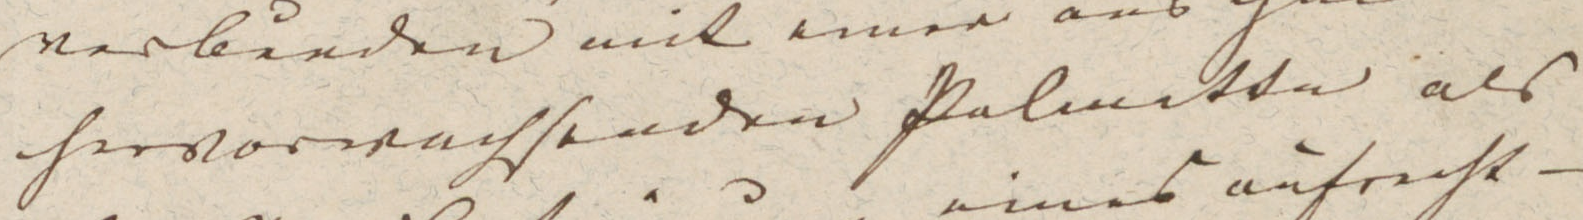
hervorwachsenden Palmette als
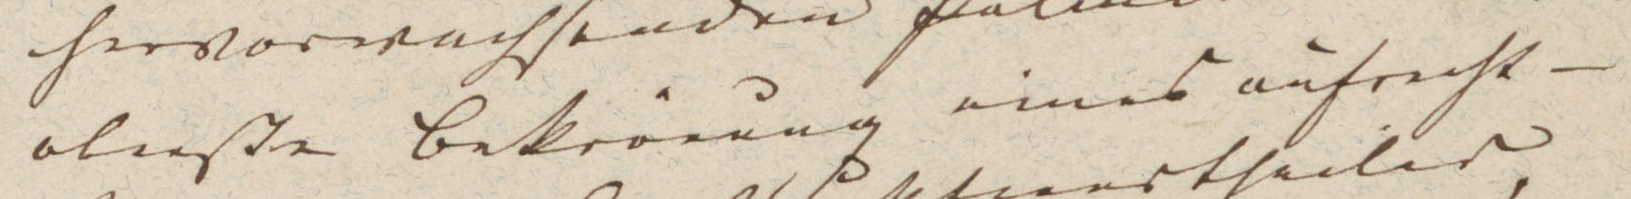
oberste Bekrönung eines aufrecht-
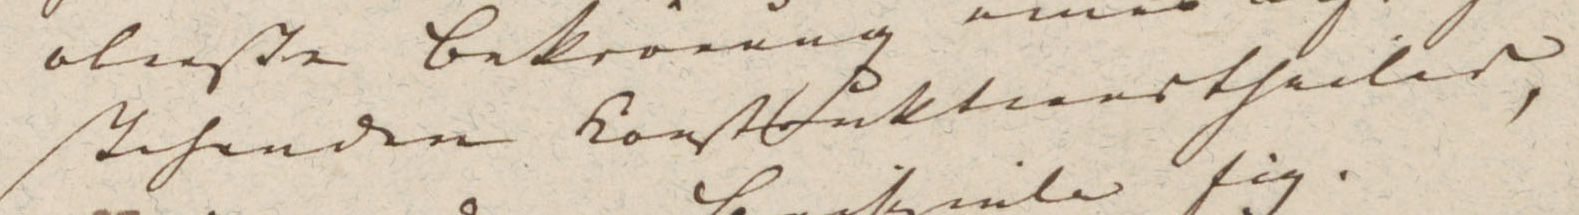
stehenden Konstruktionstheiles,
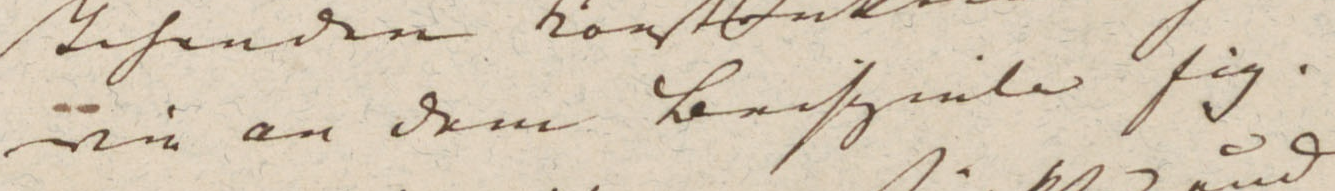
wie an dem Beispiele fig.
